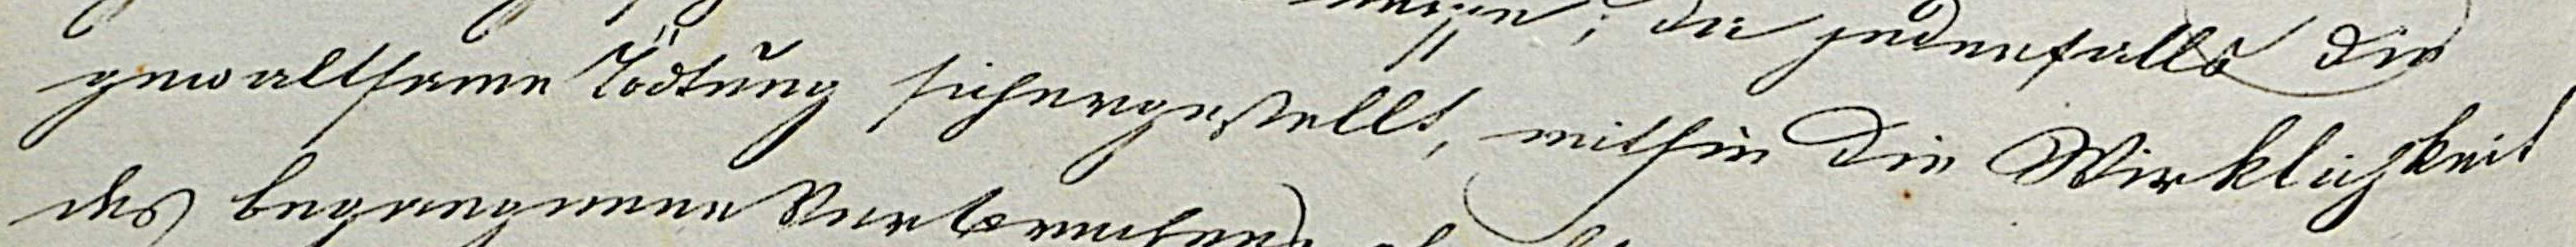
gewaltsame Tödtung sichergestellt, mithin die Wirklichkeit
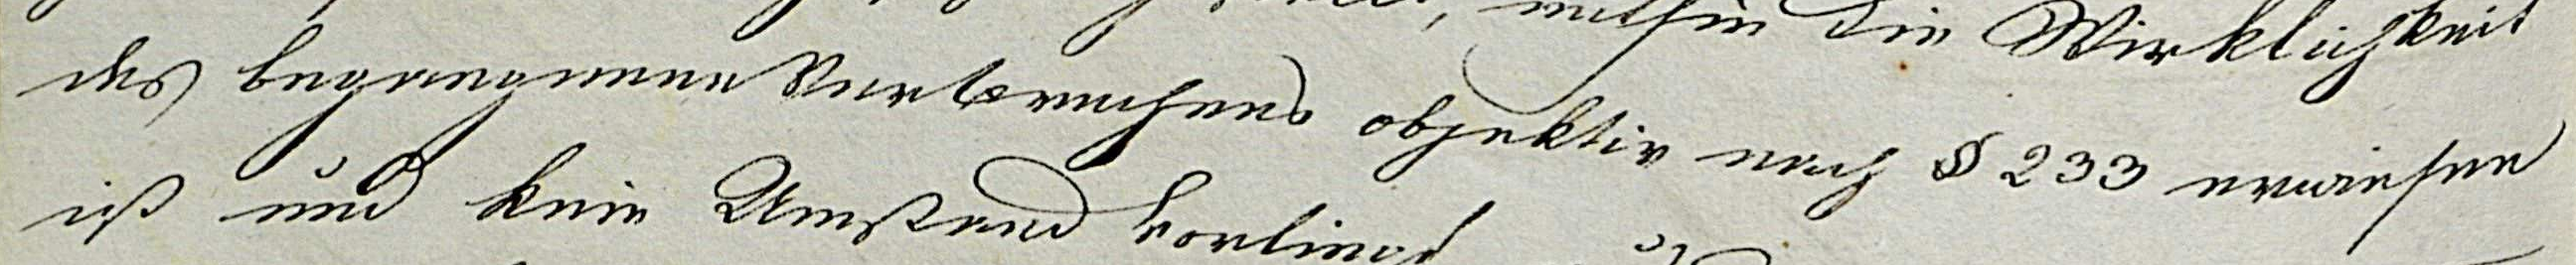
des begangenen Verbrechens objektiv nach §233 erwisen
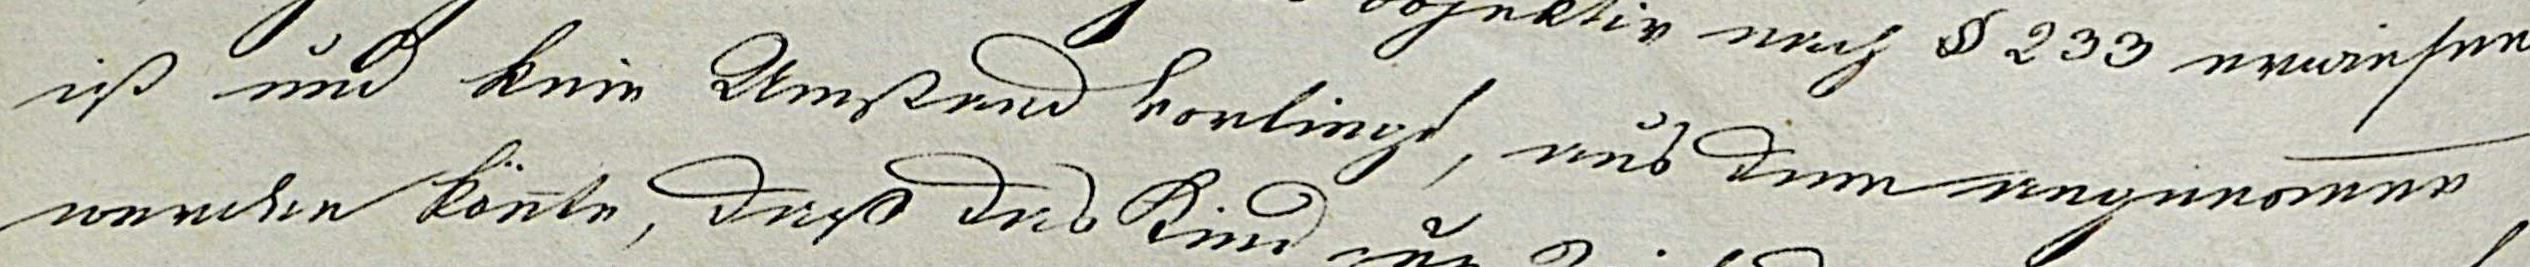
ist und kein Umstand vorliegt, aus dem angenommene
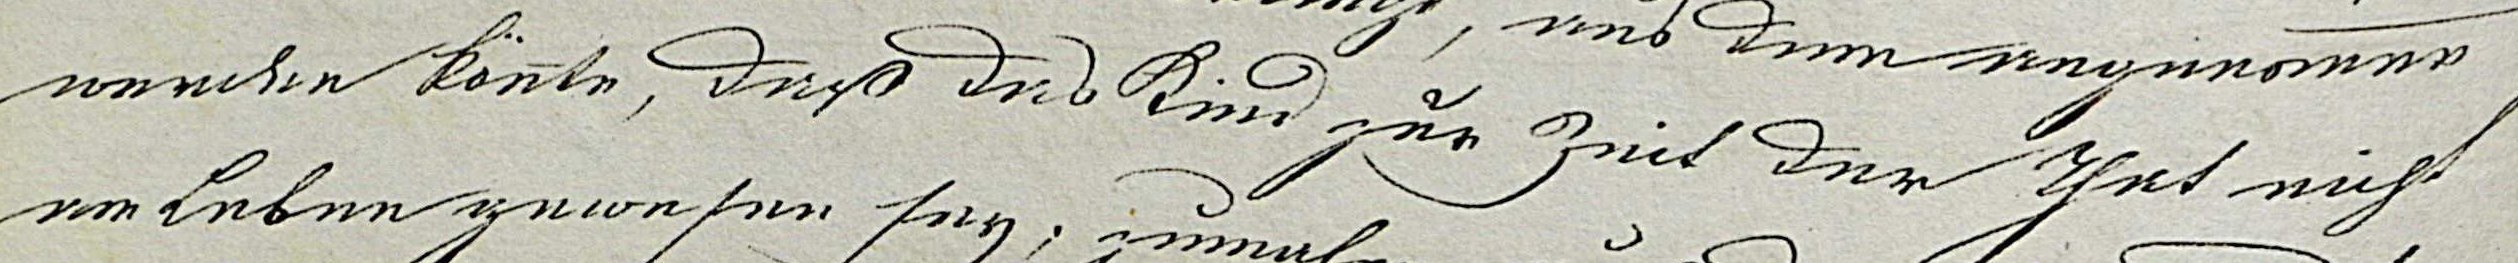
werden könnte, daß das Kind zur Zeit der That nicht
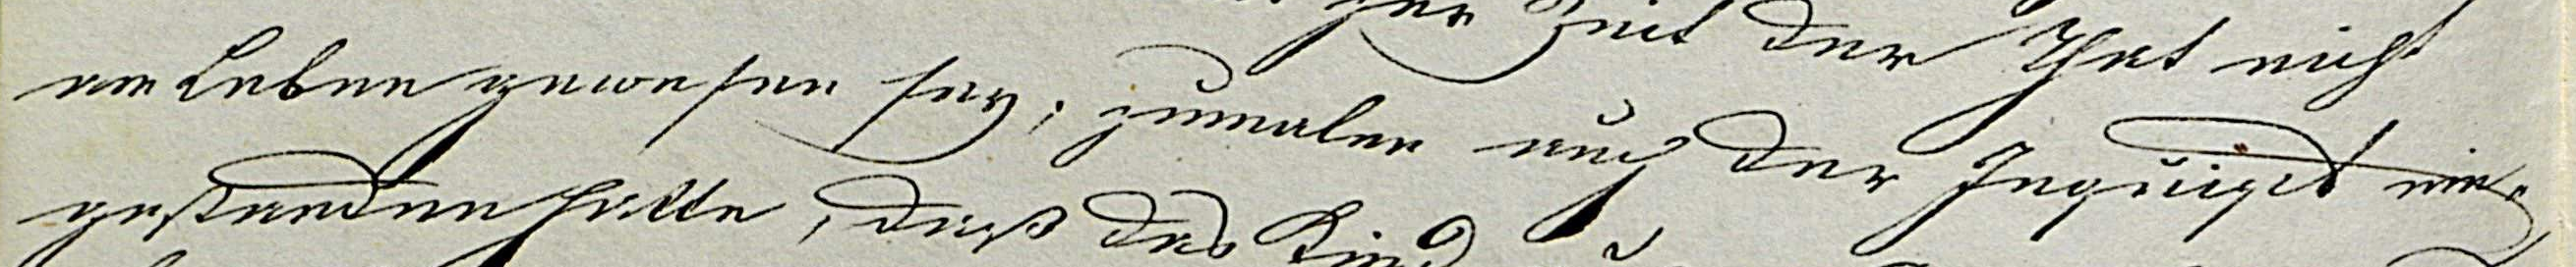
am Leben gewesen sey; zumalen auch der Inquisit ein¬
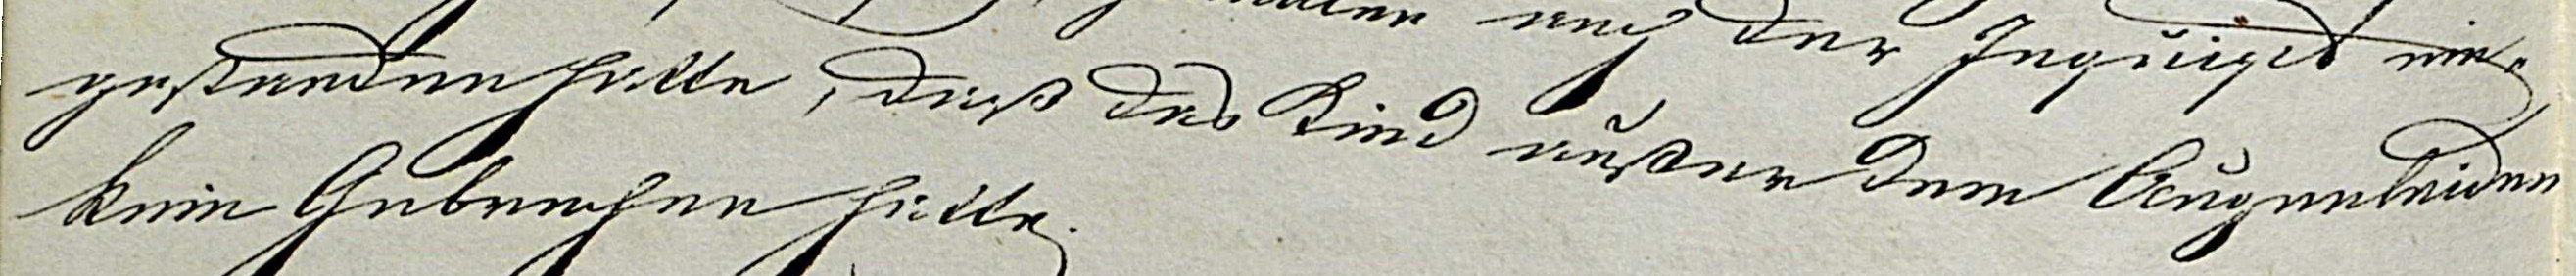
gestanden hatte, daß das Kind außer dem Augenleiden
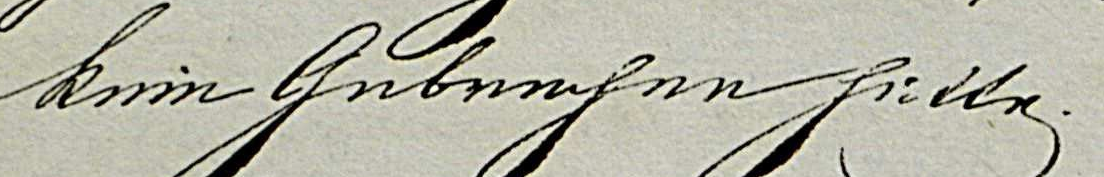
kein Gebrechen hatte.
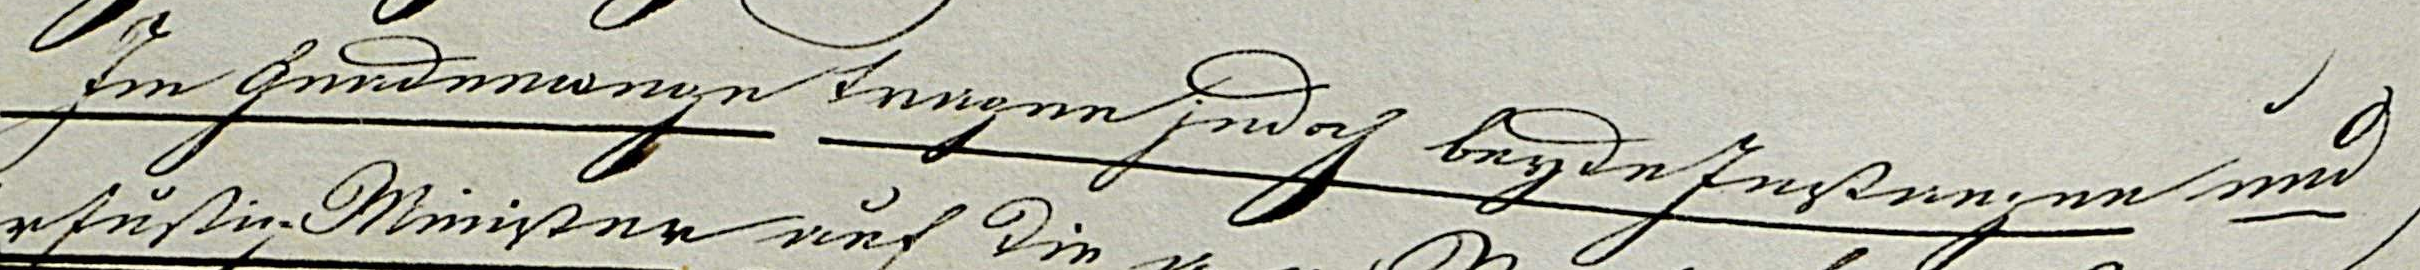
Im Gnadenwege tragen jedoch beyde Instanzen und
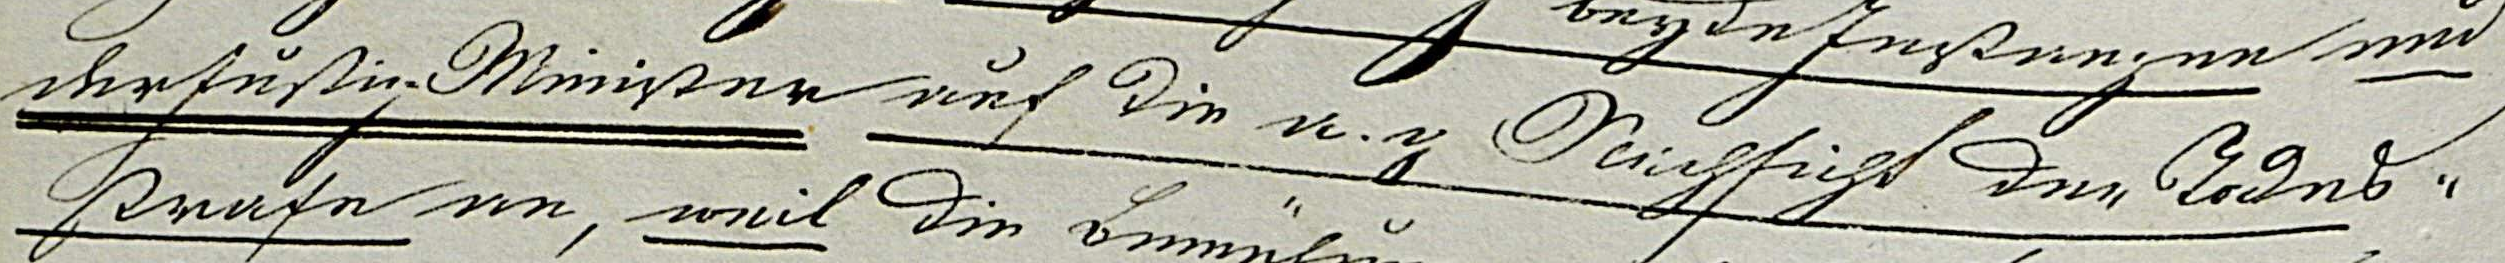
der Justiz Minister auf die a.g. Nachsicht der Todes¬
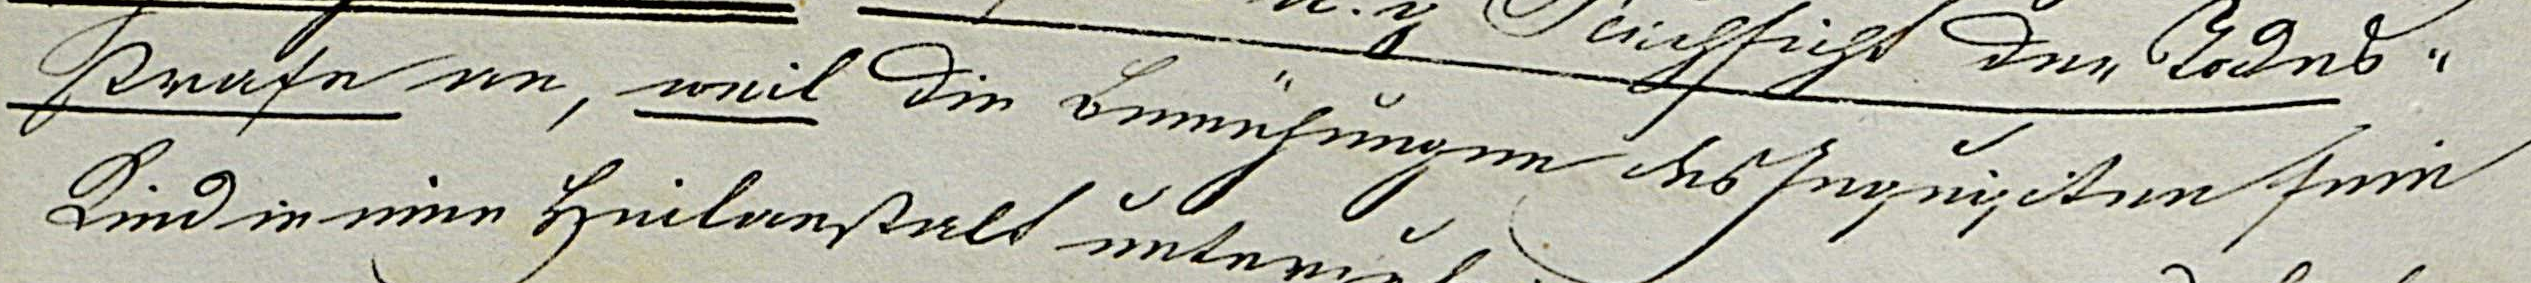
strafe an, weil die Bemühungen des Inquisiten sein
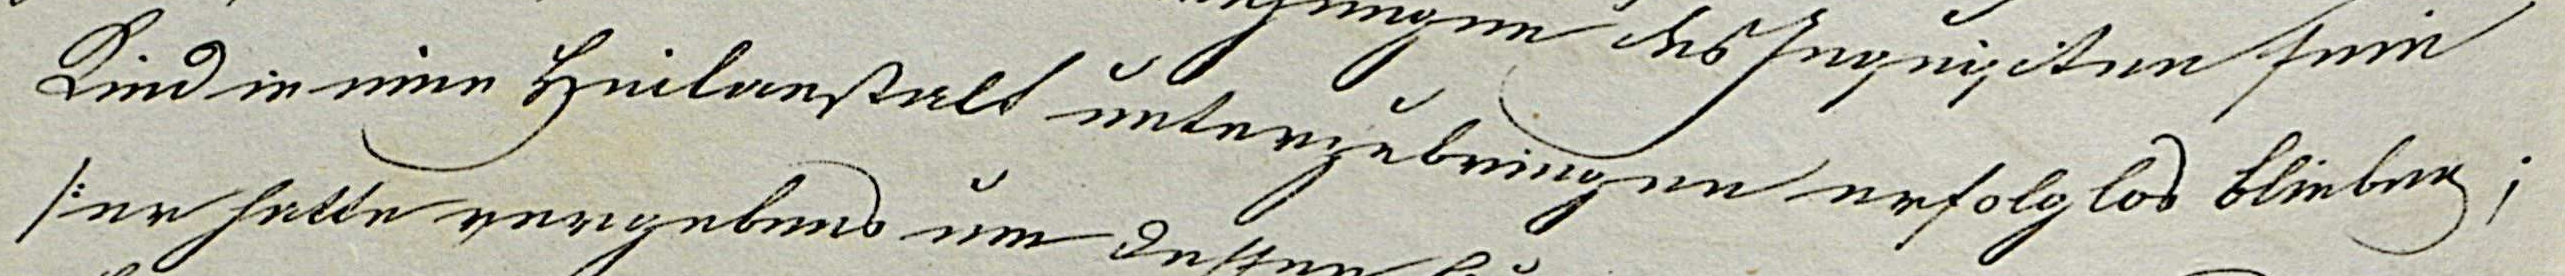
Kind in eine Heilanstalt unterzubringen erfolglos blieben;
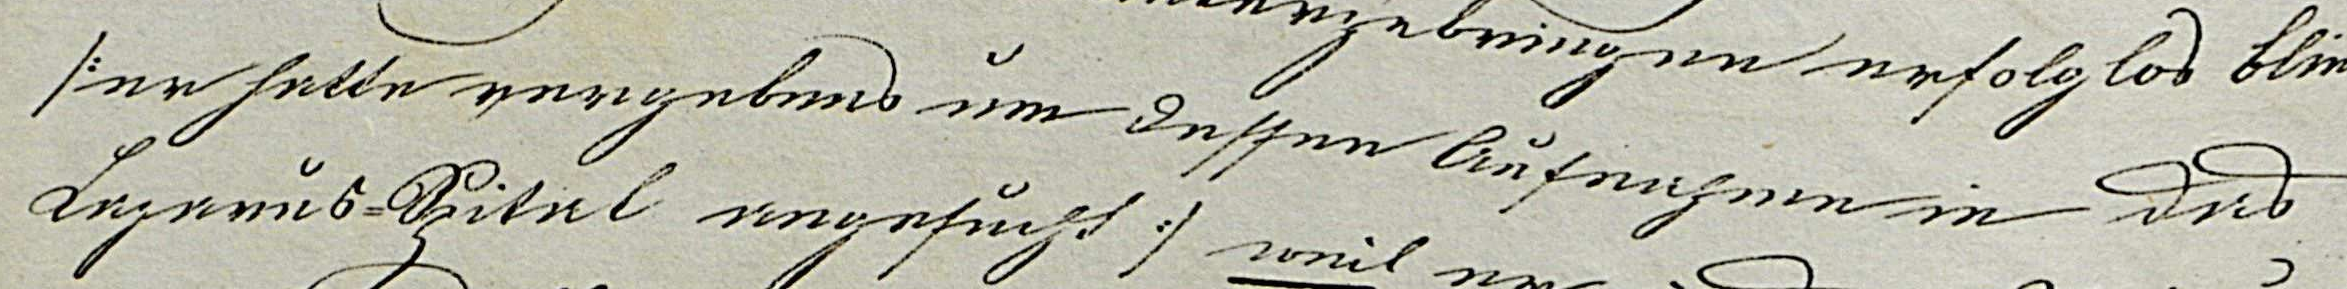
(er hatte vergebens um dessen Aufnahme in das
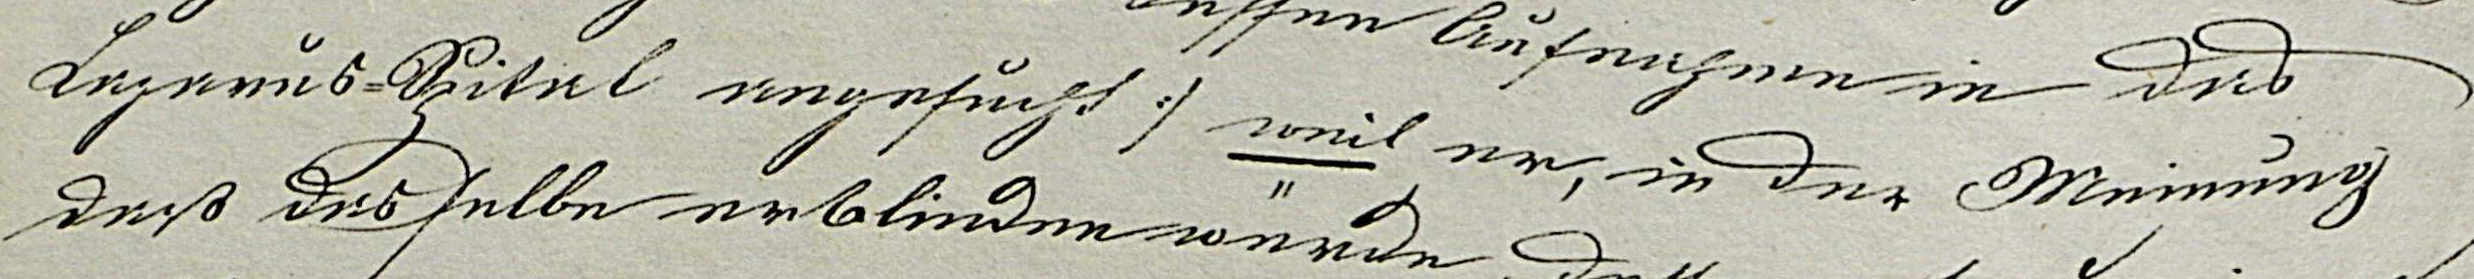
Lazarus-Spital angesucht) weil er, in der Meinung
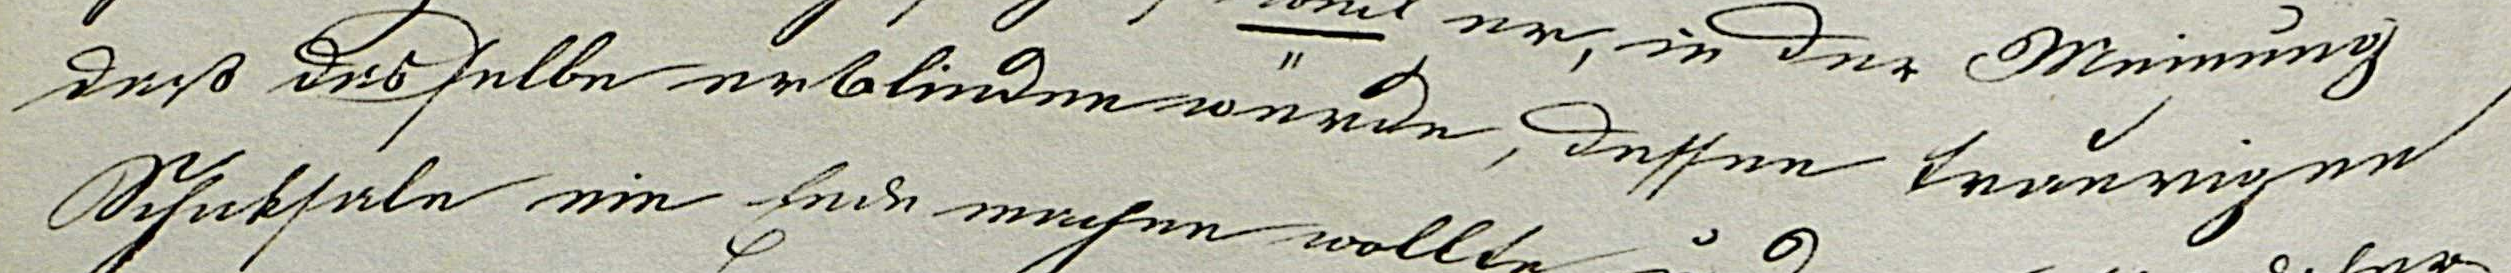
daß dasselbe erblinden würde, dessen traurigen
